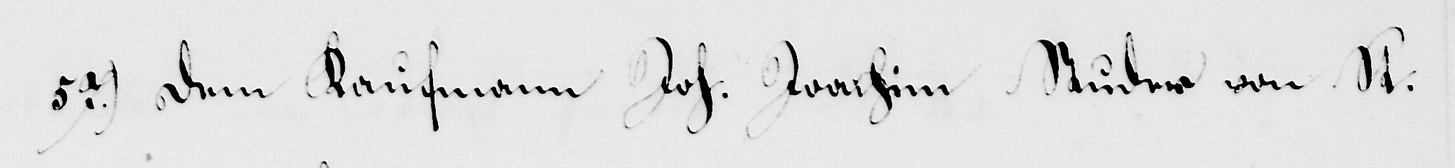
57.) dem Kaufmann Joh. Joachim Studer von St.
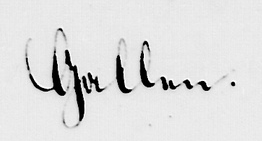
Gallen.
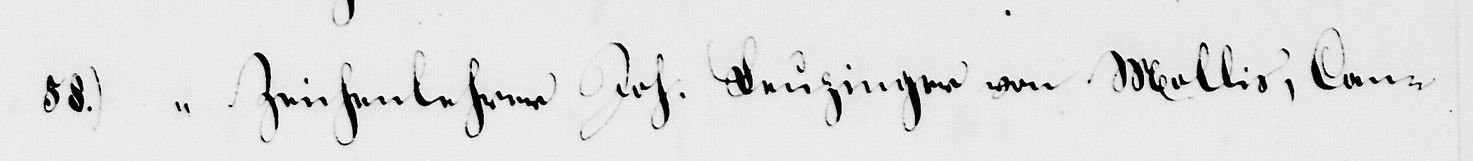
58.) " Zeichenlehrer Joh. Leuzinger von Mollis, Can¬
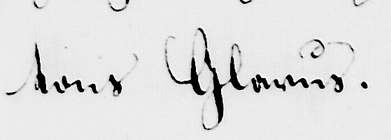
tons Glarus.
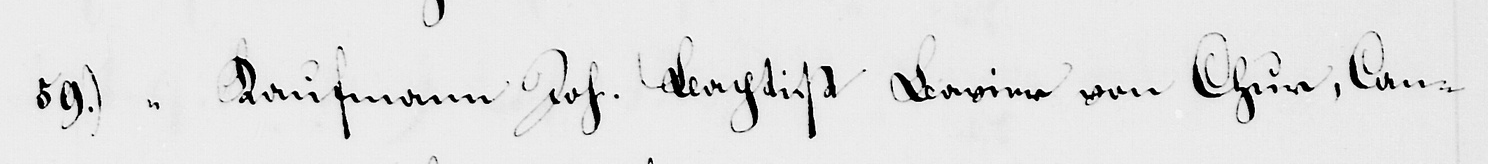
59.) " Kaufmann Joh. Baptist Bavier von Chur, Can¬
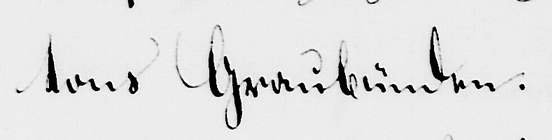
tons Graubünden.
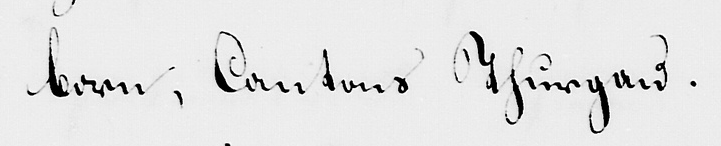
born, Cantons Thurgau.
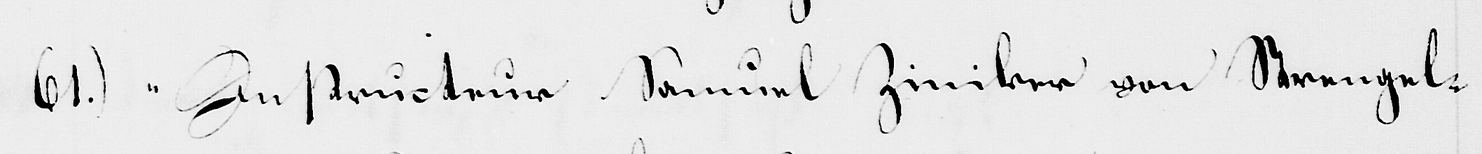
61.) " Instructeur Samuel Ziniker von Strengel¬
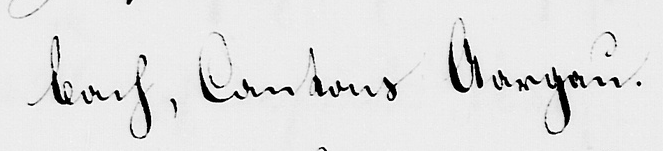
bach, Cantons Aargau.
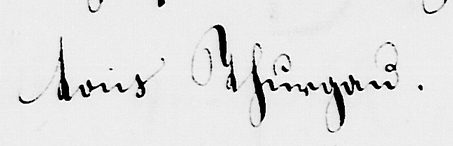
tons Thurgau.
